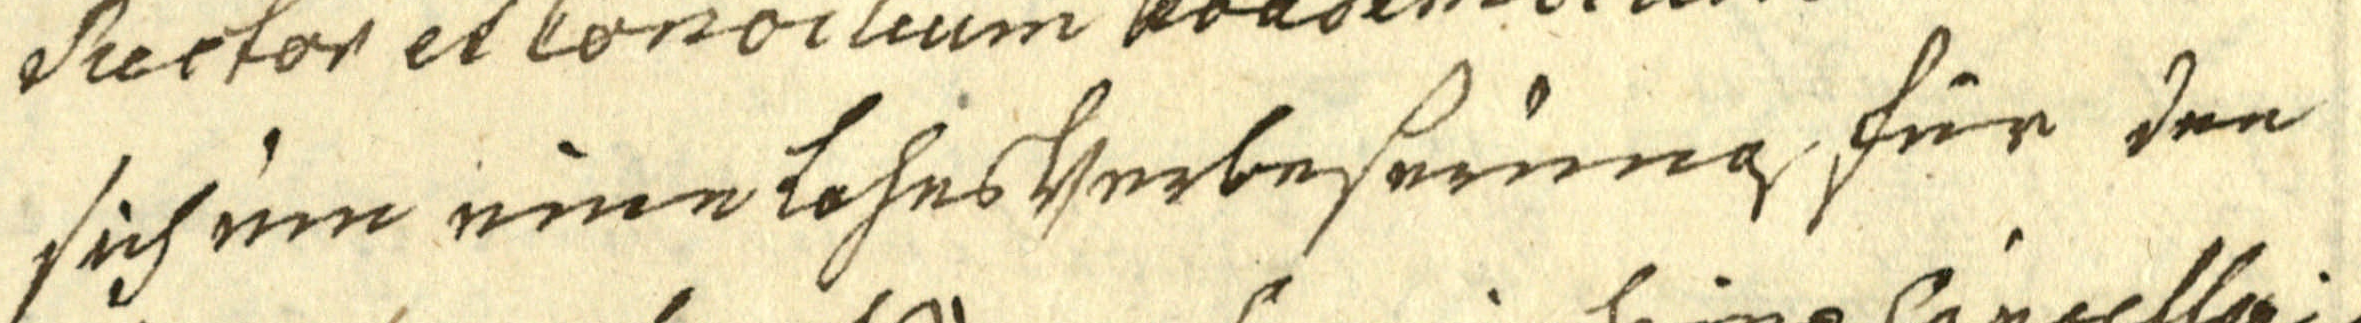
sich um eine LohnsVerbeßerung für den
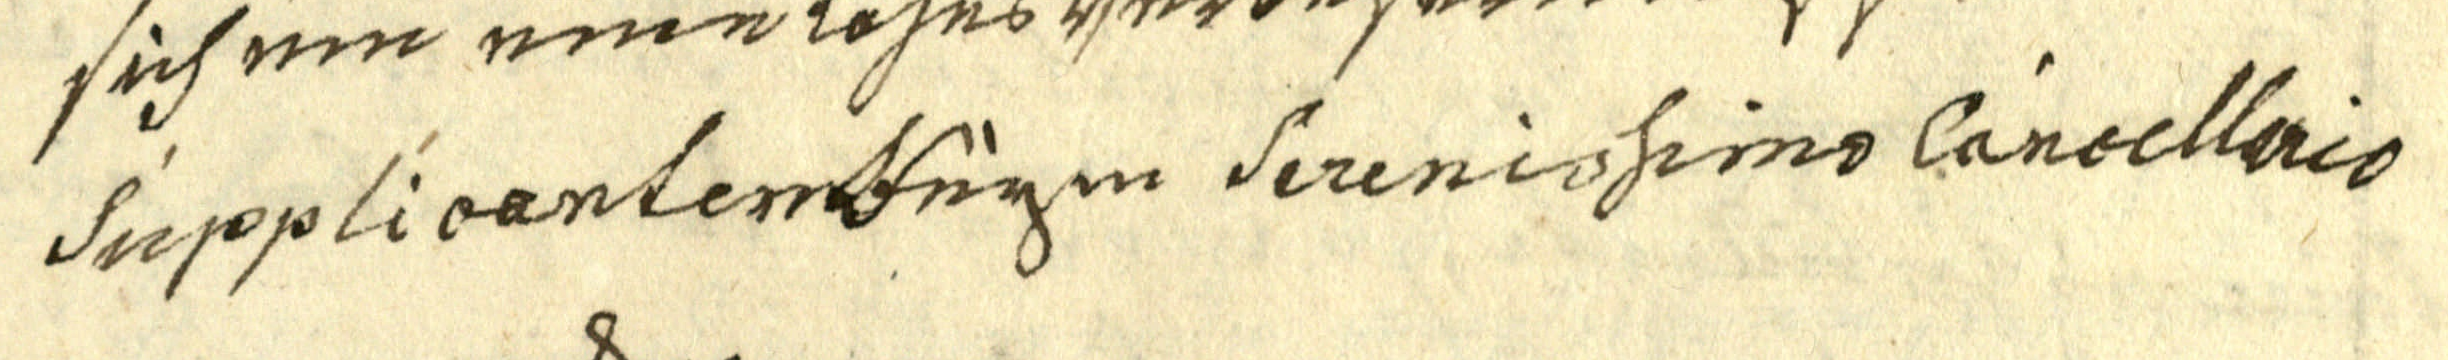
Supplicanten beÿm Serenissimo Cancellario
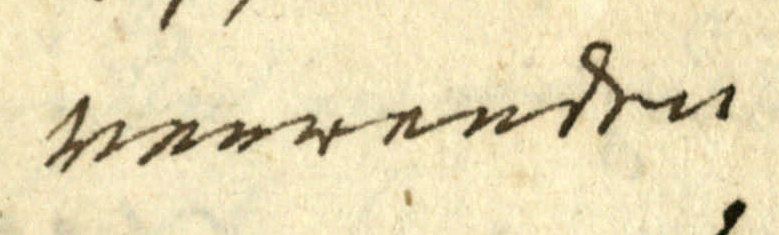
verwenden.
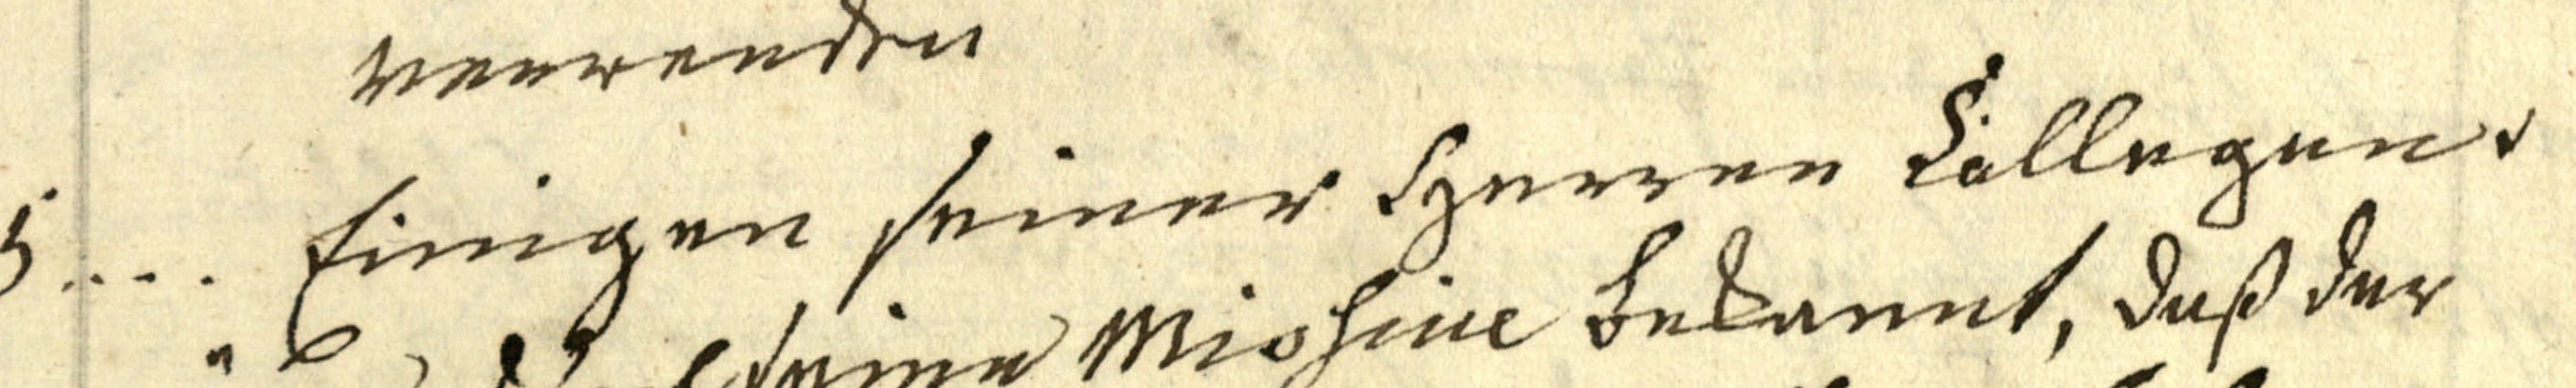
5. Einigen seiner Herren Collegen
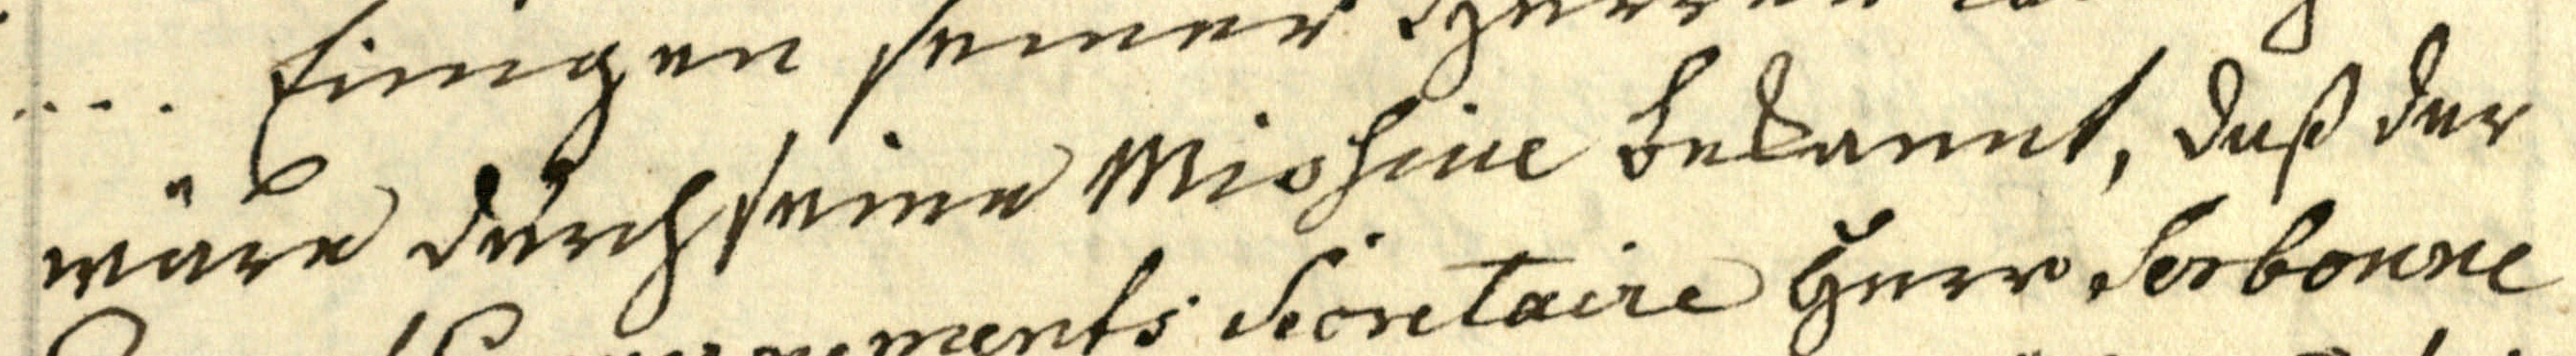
wäre durch seine Missive bekannt, daß der
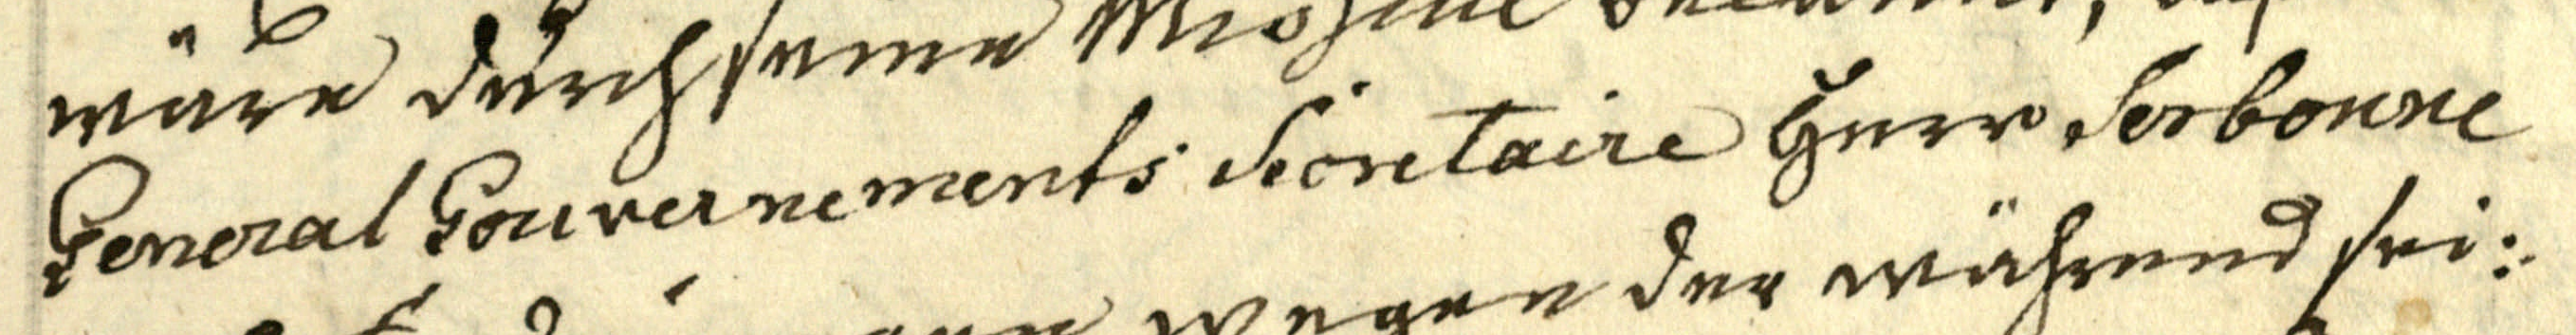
General Gouvernements Secretaire Herrn Sorbonne
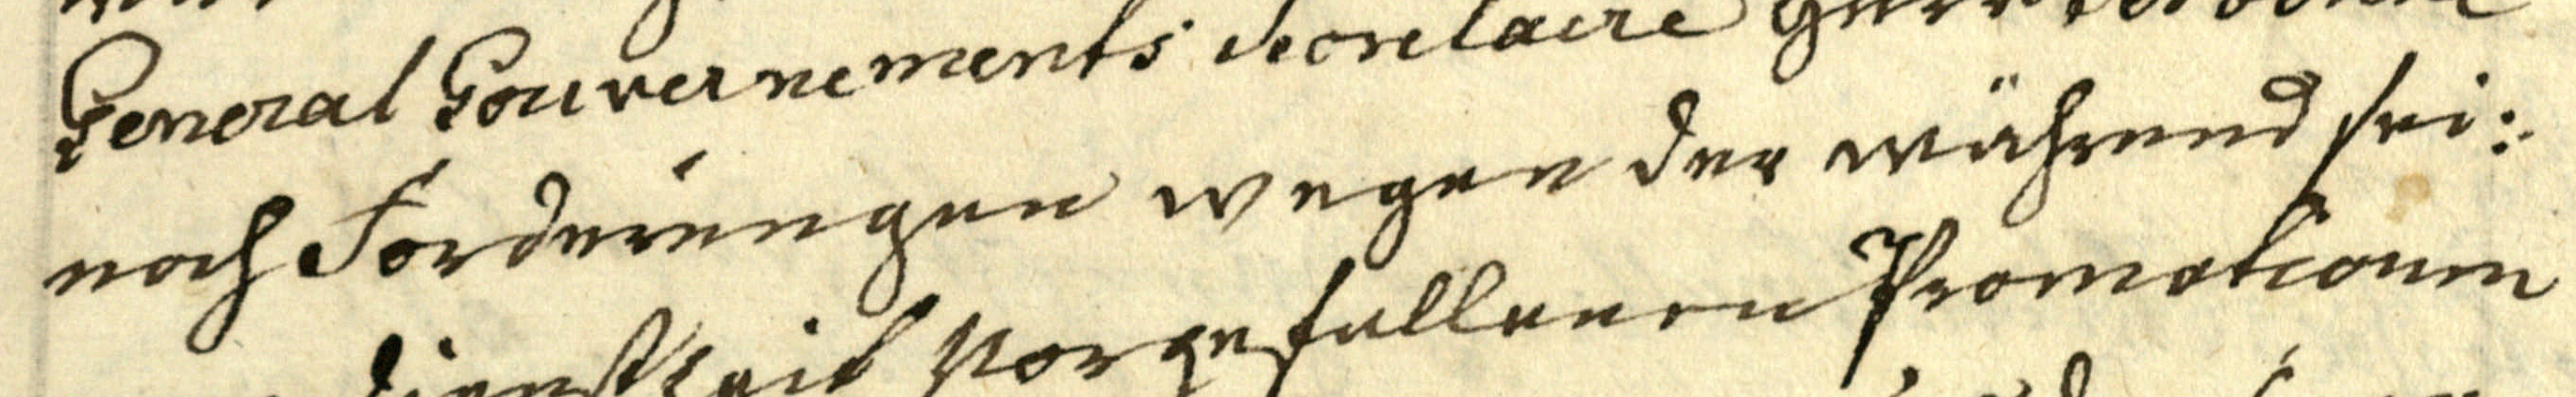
noch Forderungen wegen der während sei¬
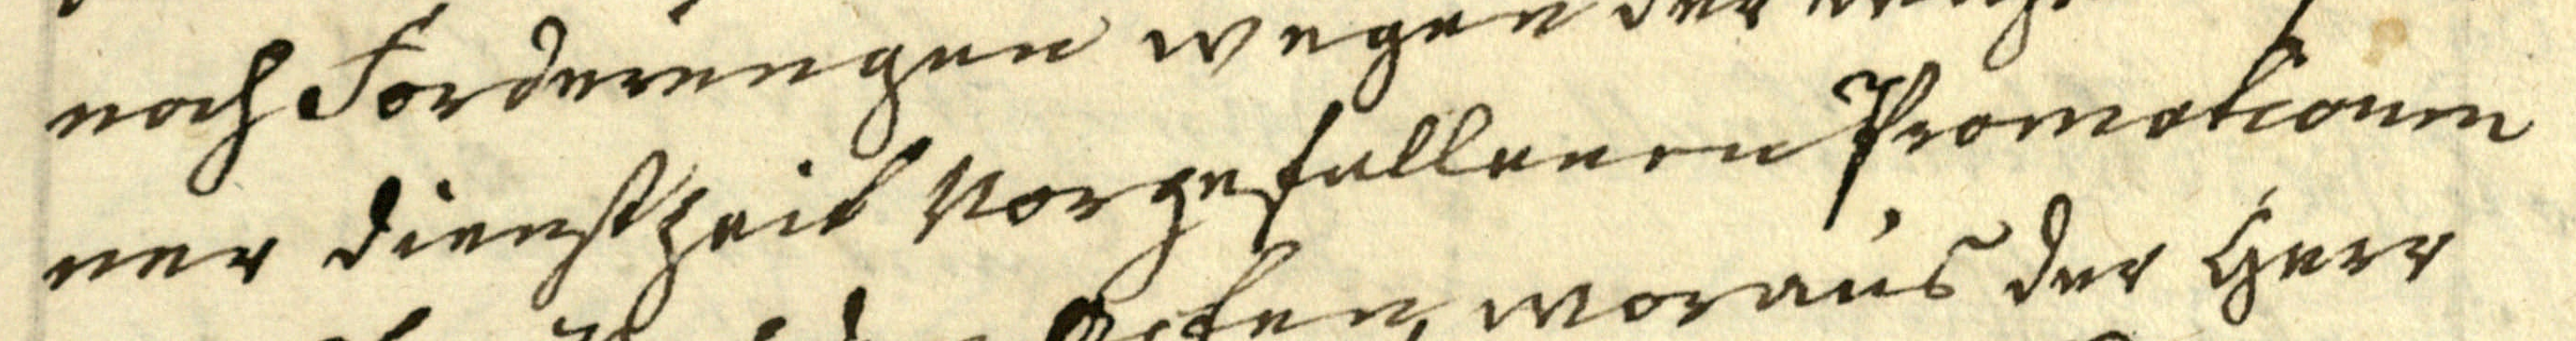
ner dienstzeit vorgefallenen Promotionen
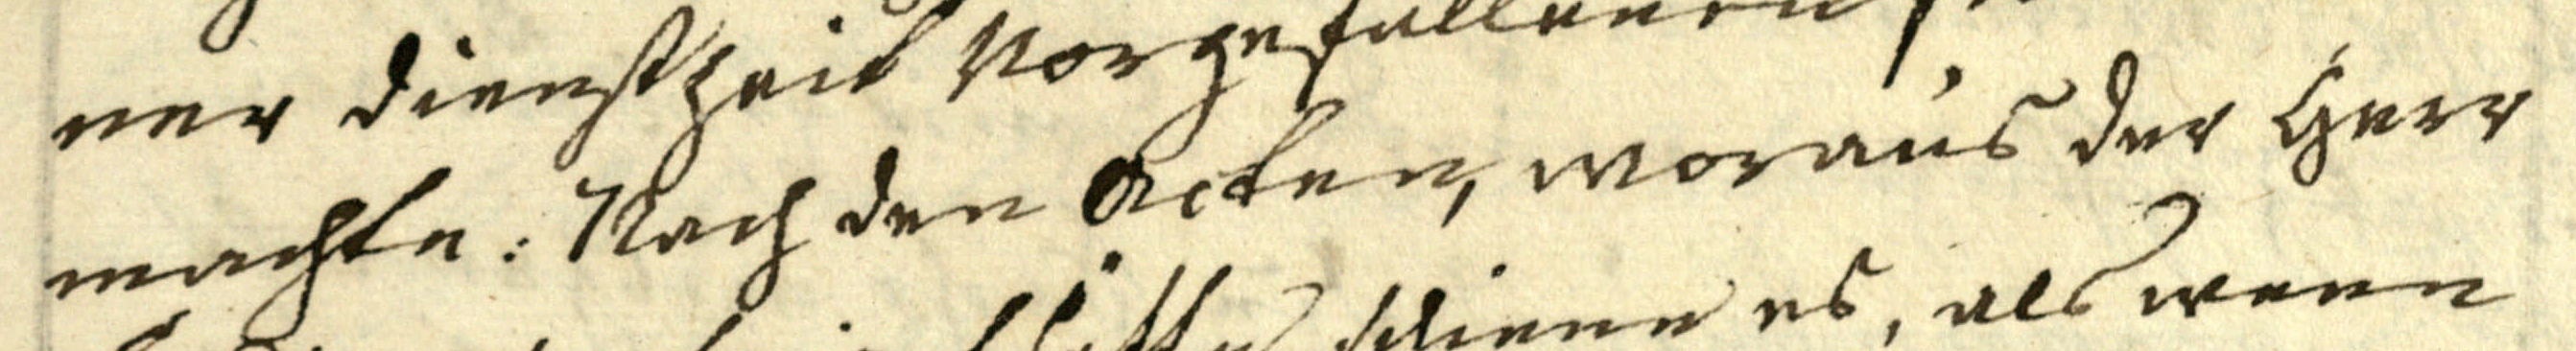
machte. Nach den Acten, woraus der Herr
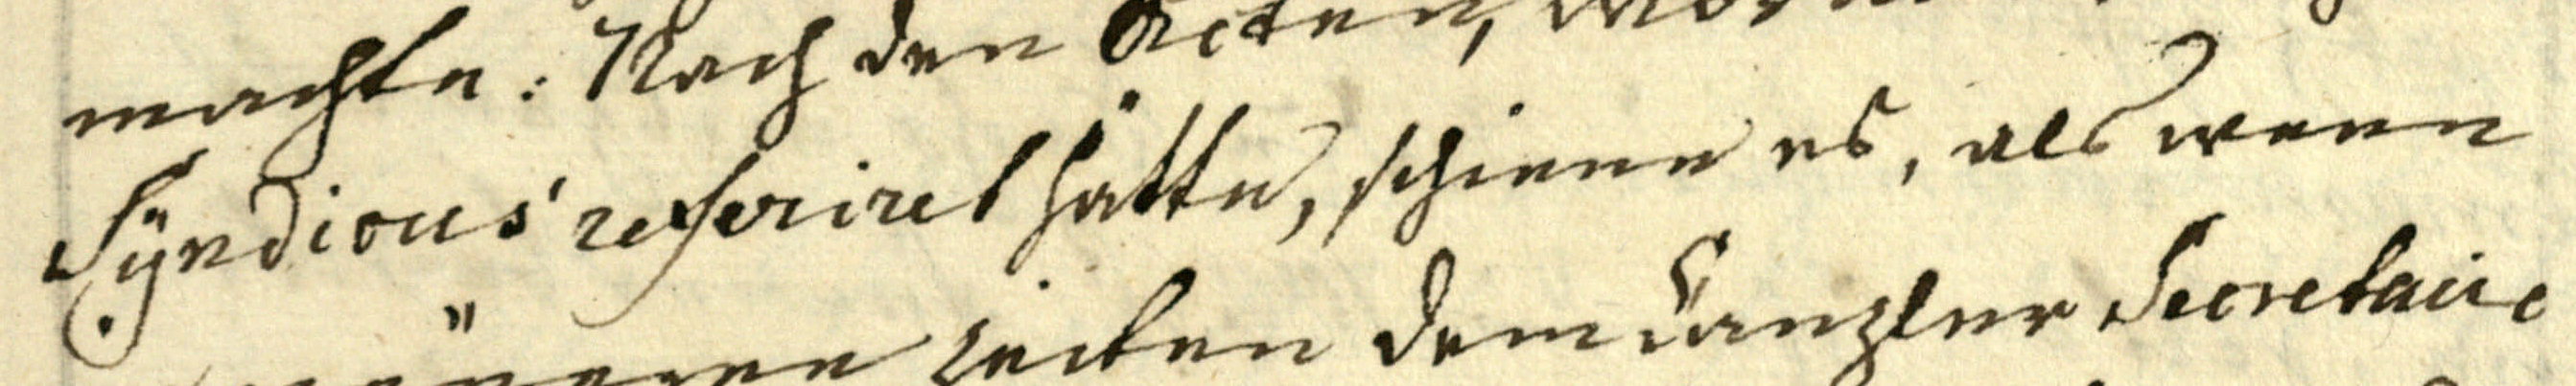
Sÿndicus referiret hätte, schiene es, als wenn
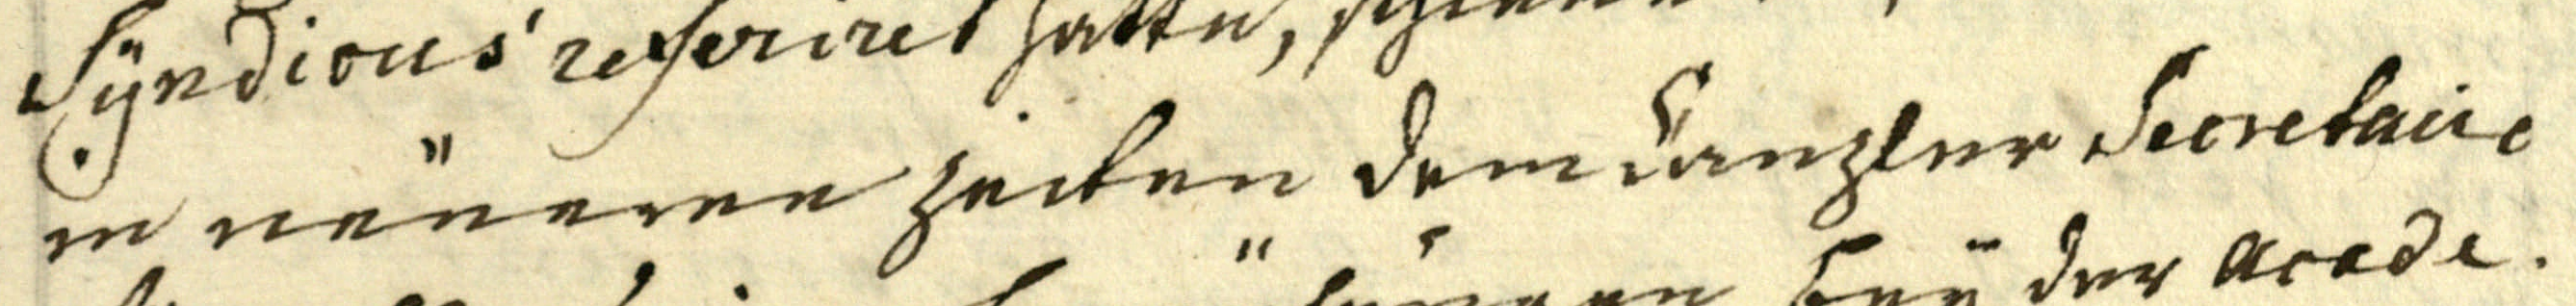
in neueren Zeiten dem Kanzler Secretaire
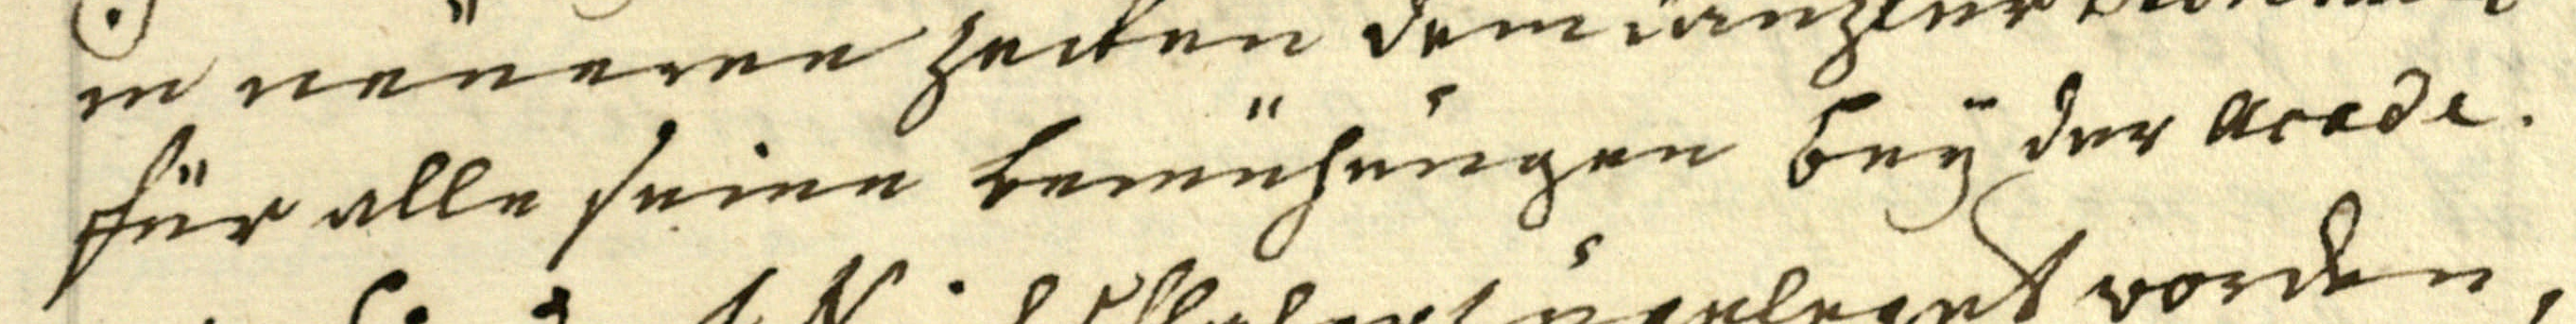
für alle seine Bemühungen beÿ der Acade¬
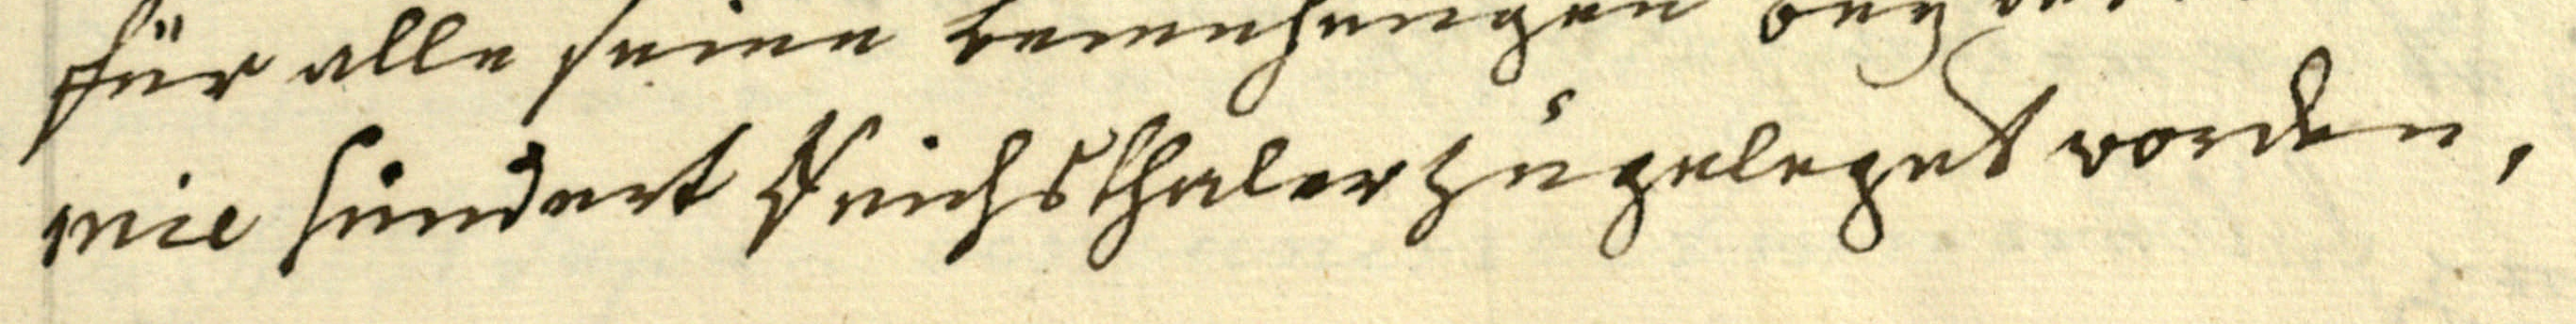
mie hundert Reichsthaler zugelegt worden,
